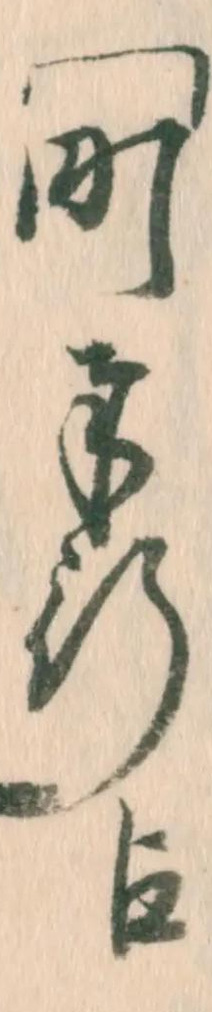│[町奉行え
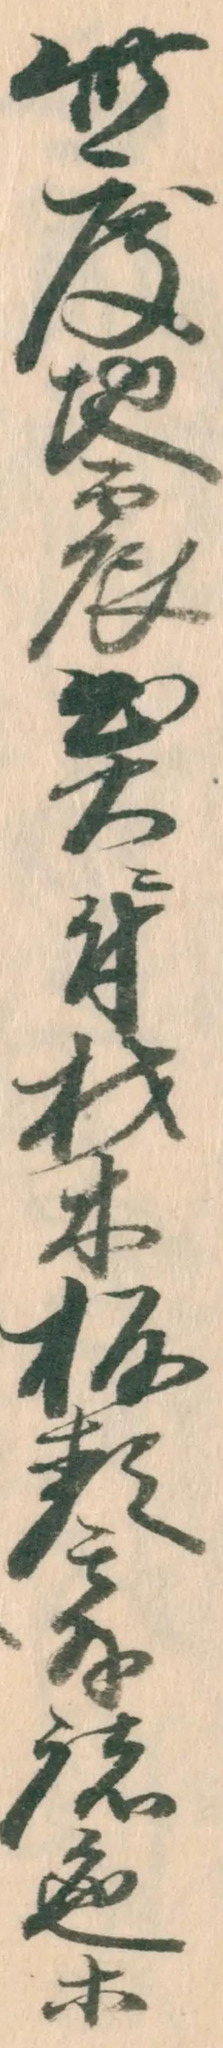此度地震出火ニ付材木板類其外諸色等
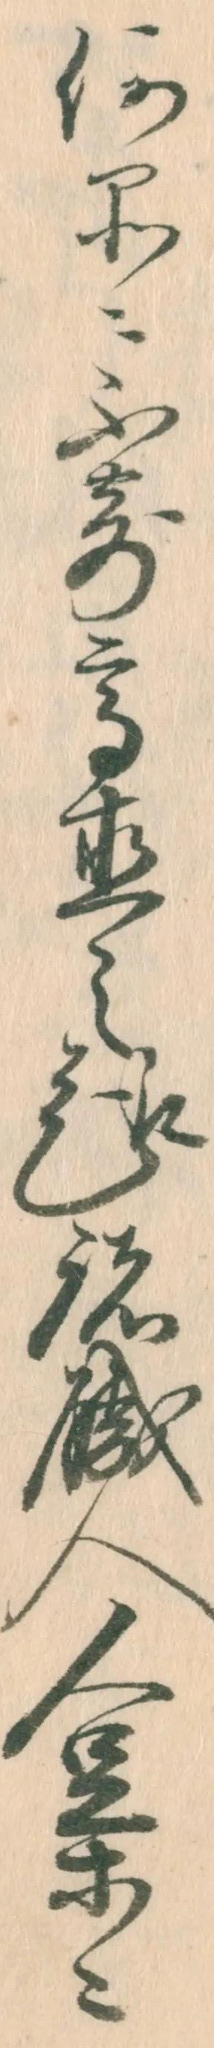何品ニ不寄高直之趣諸職人人足等ニ
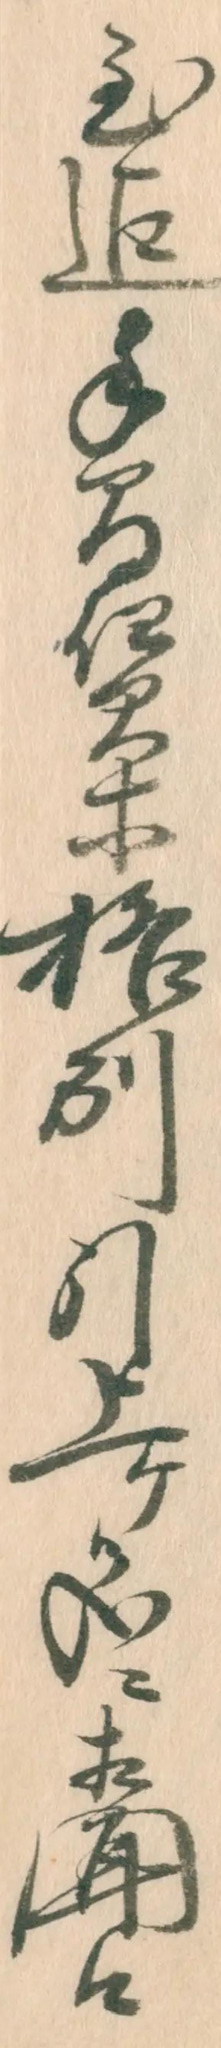至迄手間賃等格別引上ケ候哉ニ相聞候

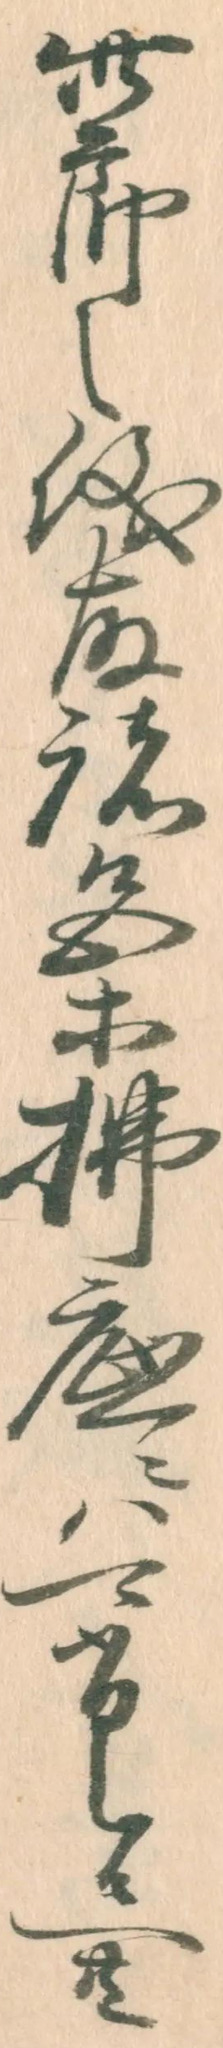此節之儀故諸色等払底ニハ可有之候へ共
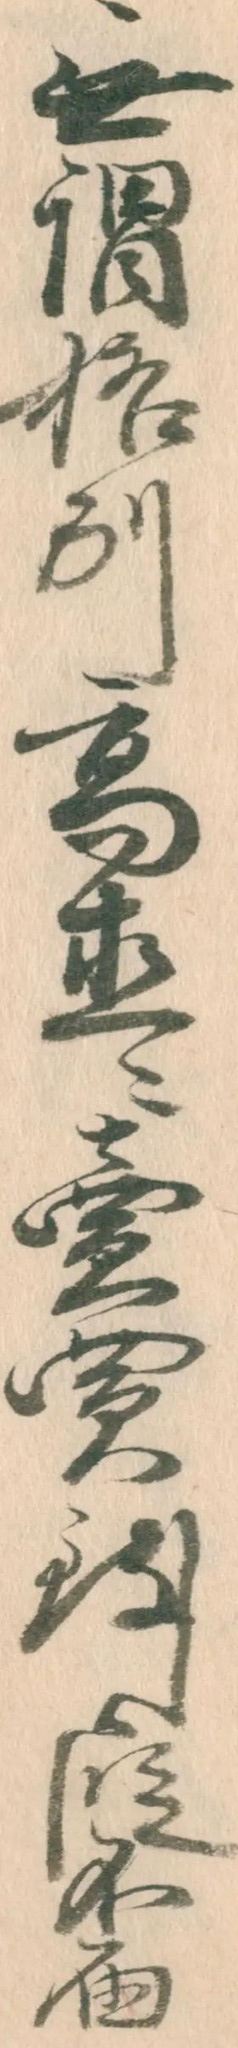無謂格別高直ニ売買致し候段不届
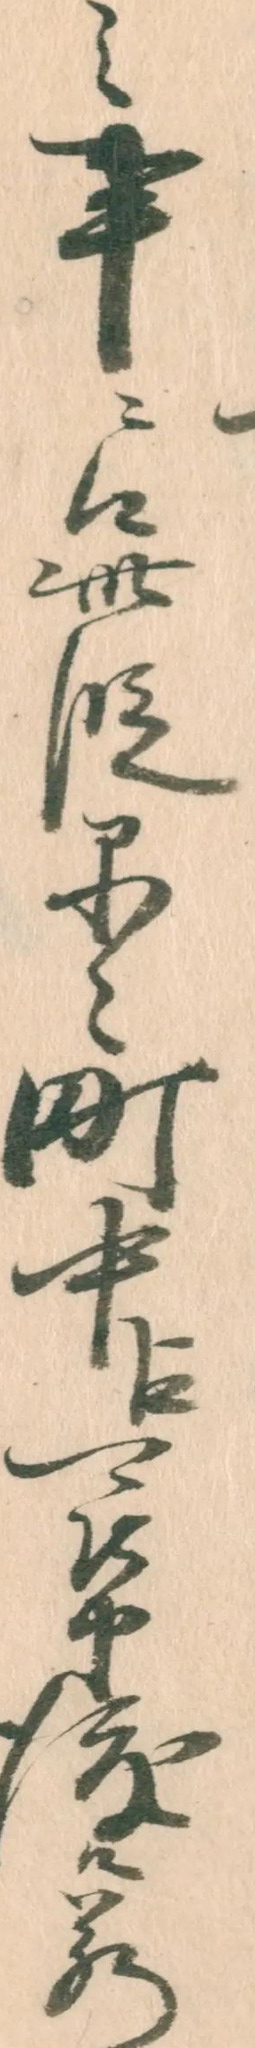之事ニ候此段早〻町中え可被申渡候若
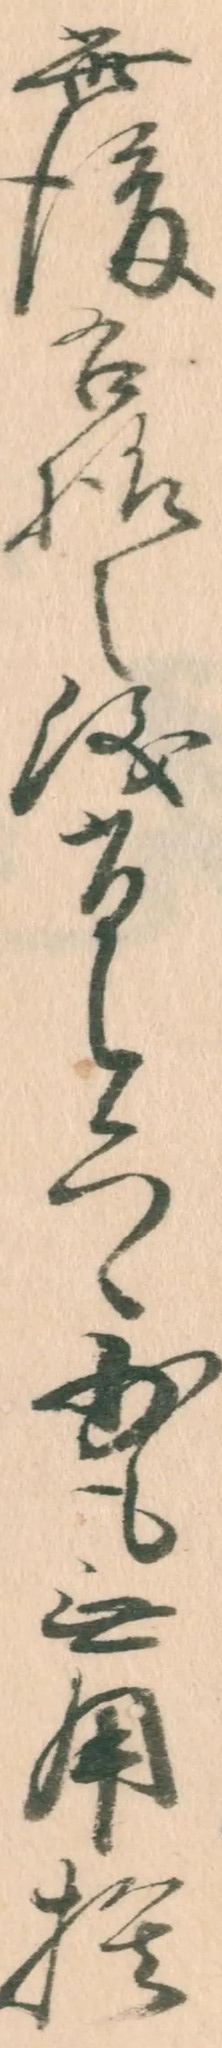此後右様之儀有之候ハヽ少も無用捨
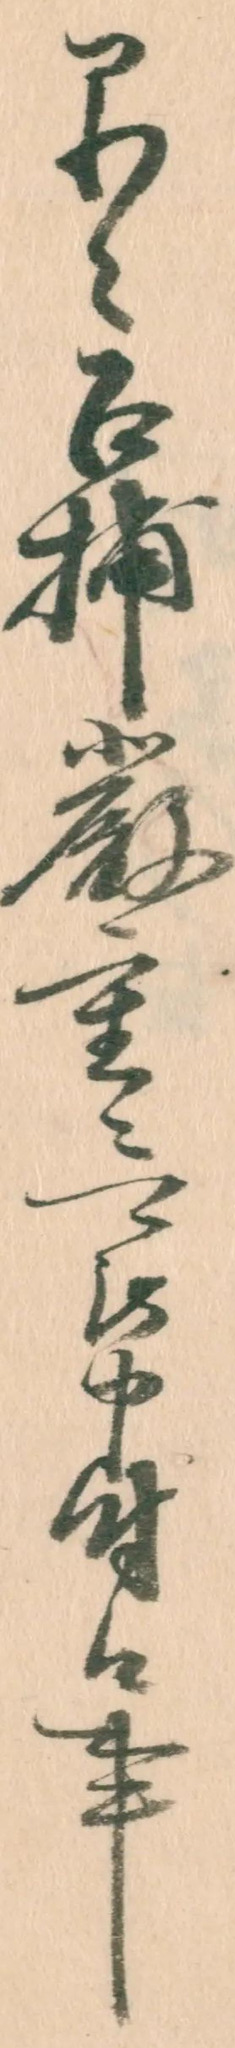早〻召捕厳重ニ可被申付候事
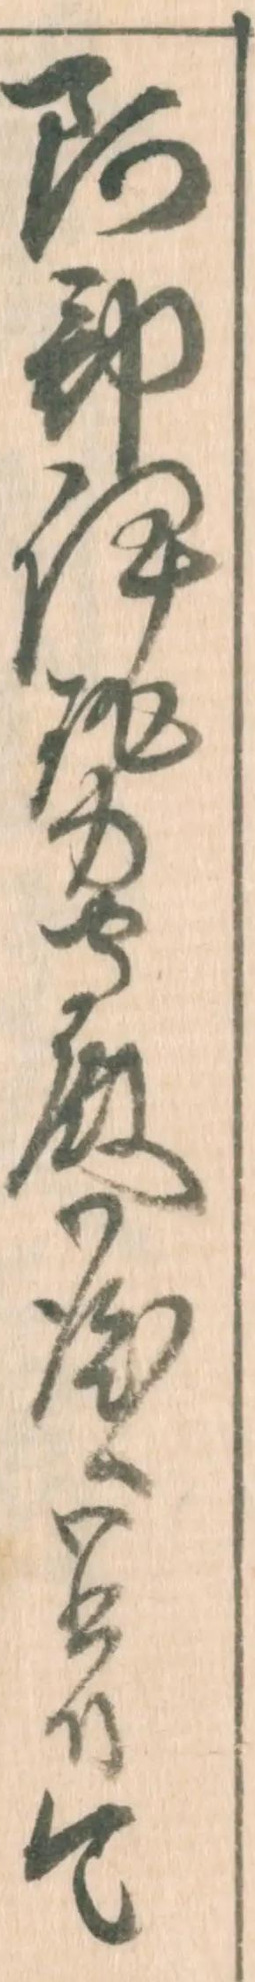│阿部伊勢守殿御渡之御書付也
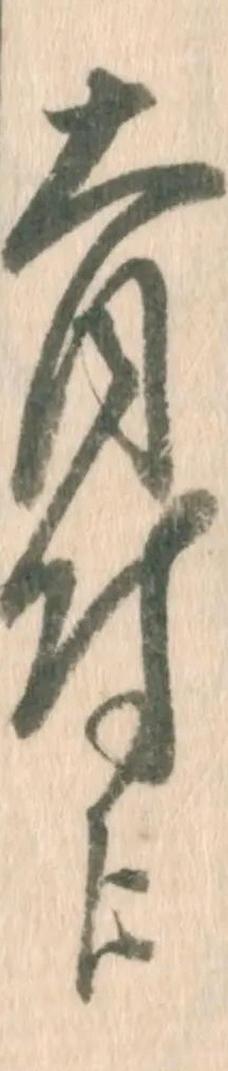│大目付え
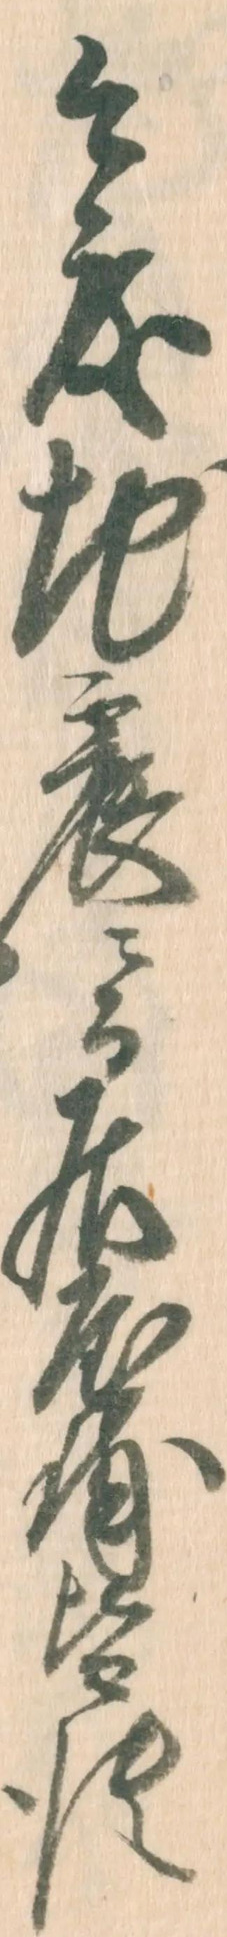今度地震ニて居屋鋪皆潰
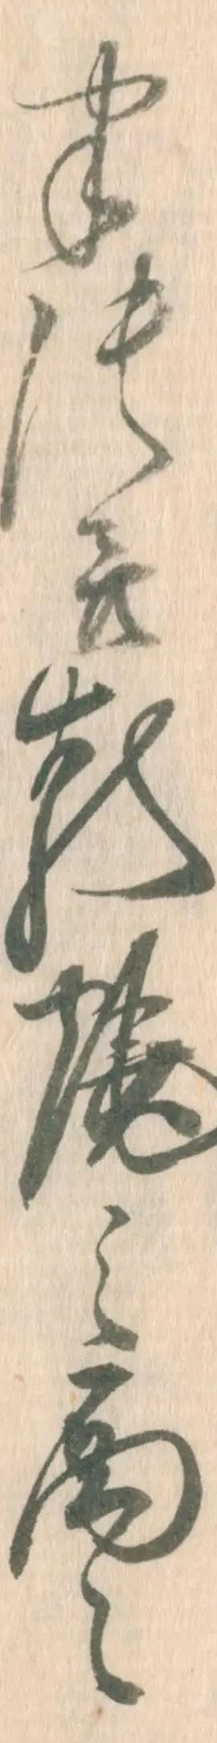半潰幷類焼之面〻
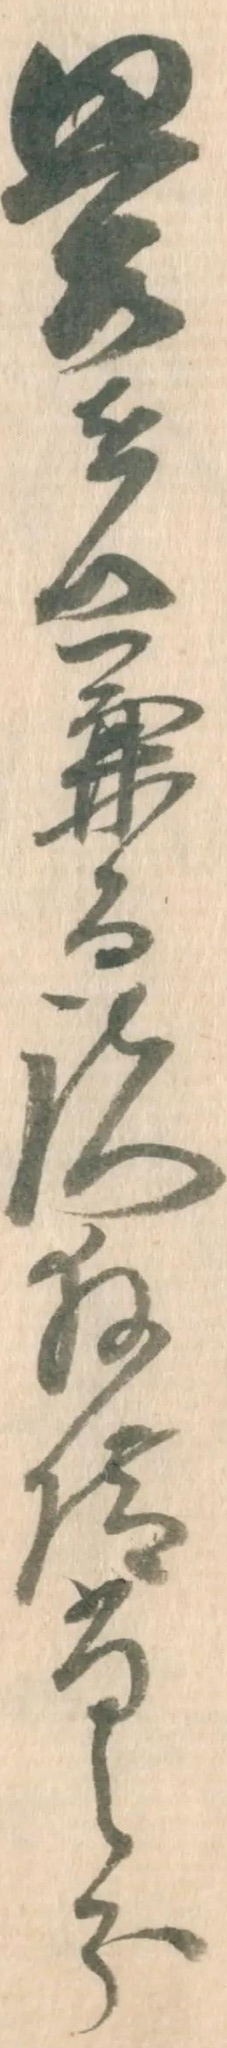思召を以兼て致拝借有之分

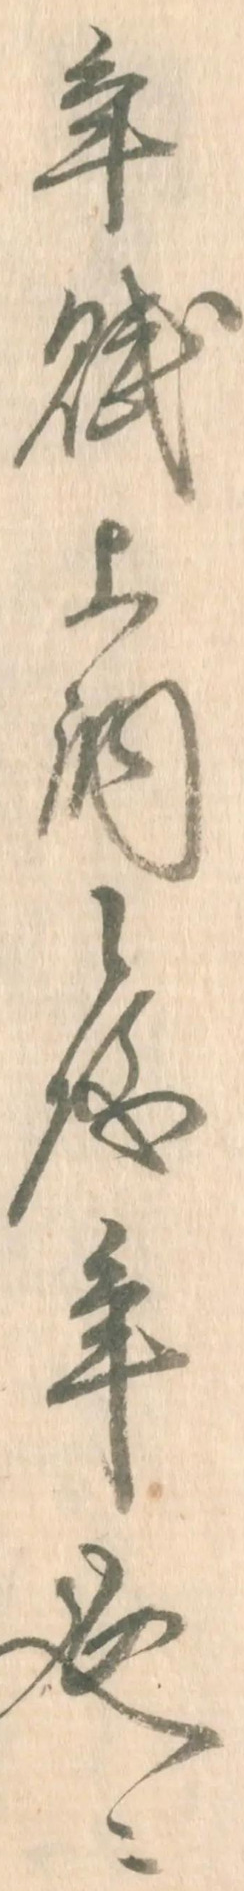年賦上納之儀年延ニ
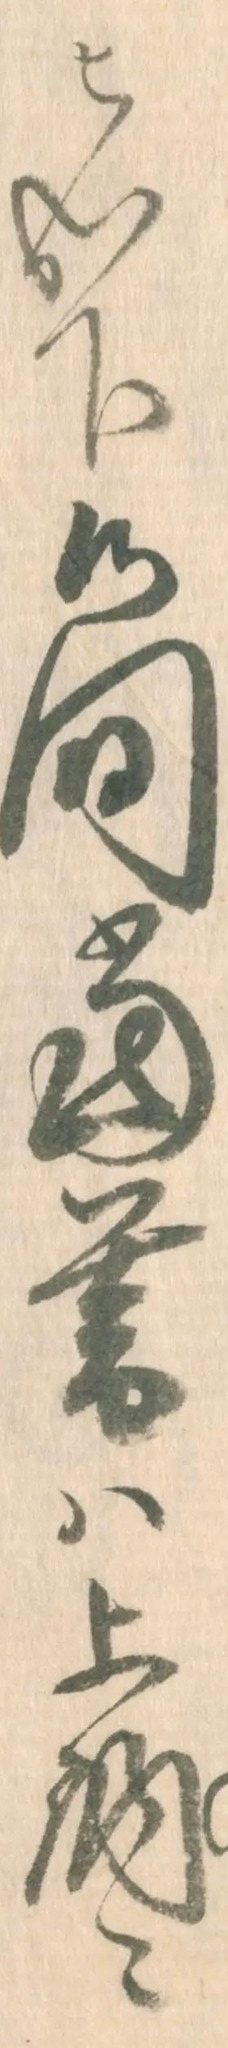被成下候間当暮ハ上納ニ
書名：地震災書留 2巻. [2] 内表紙に「地震一件　安政二卯年十月」とあり
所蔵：国立国会図書館 National Diet Library, JAPAN
